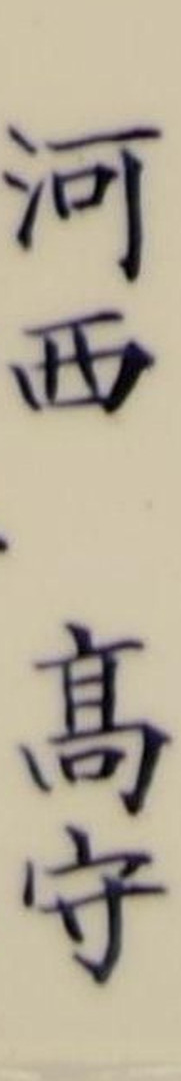河西高守
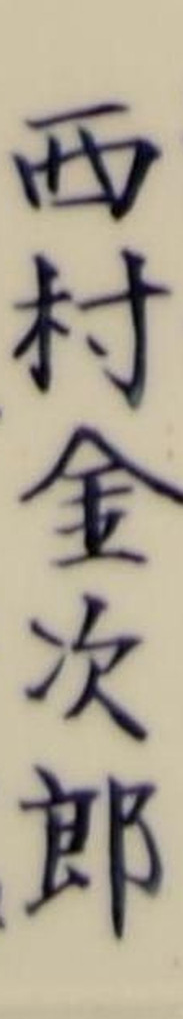西村金次郎
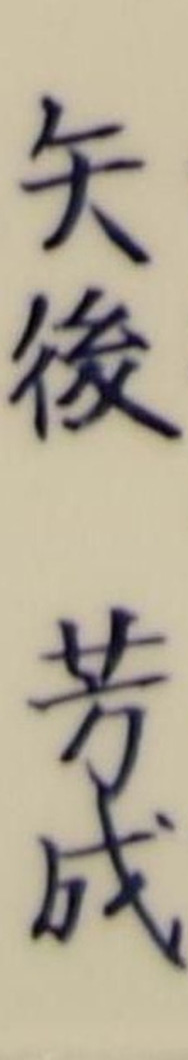矢後芳成
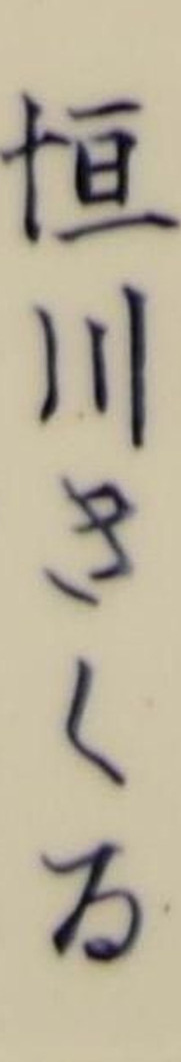恒川きくる
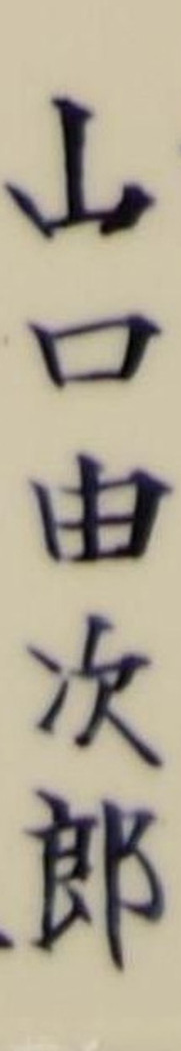山口由次郎
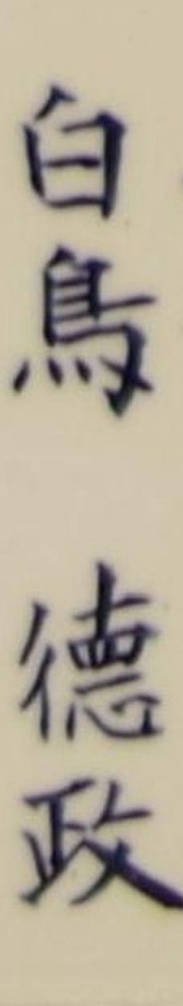白鳥徳政
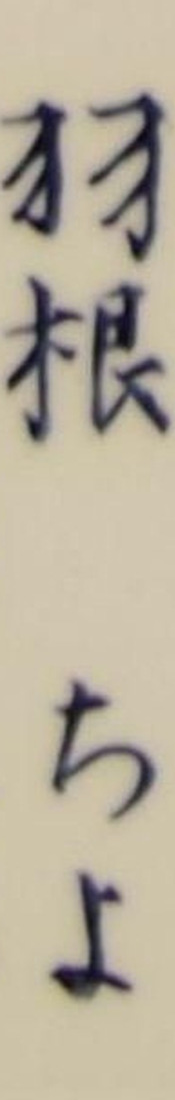羽根ちよ
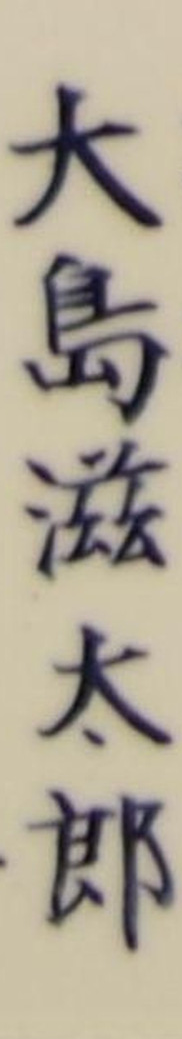大島滋太郎
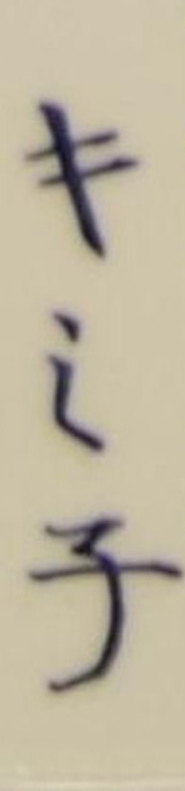キミ子
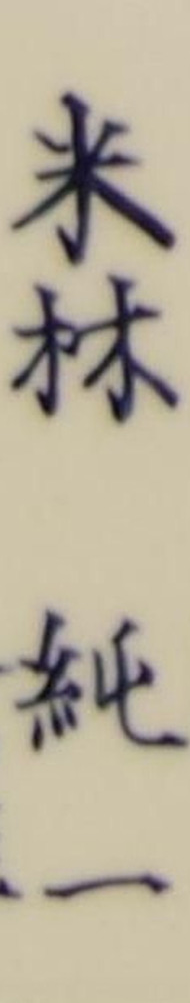米林純一
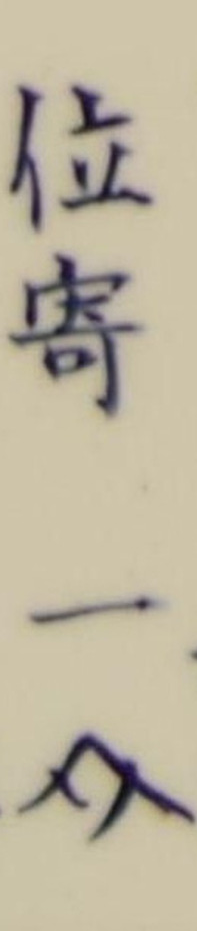位寄一介
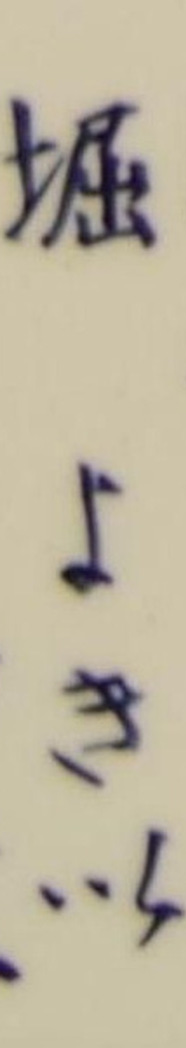堀よきい
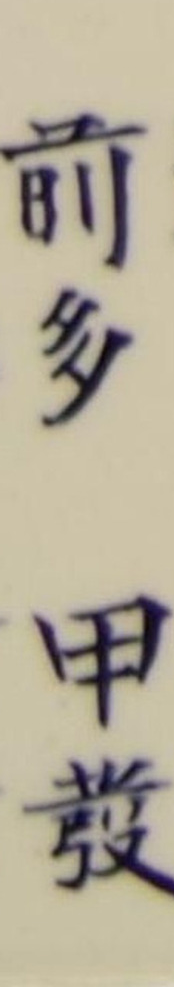前多甲発
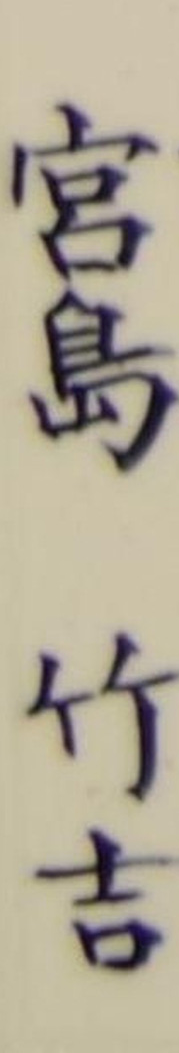宮島竹吉

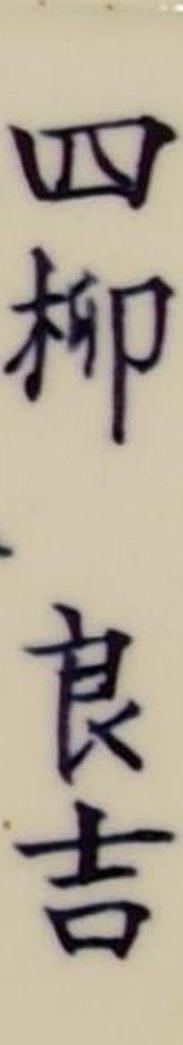四柳良吉
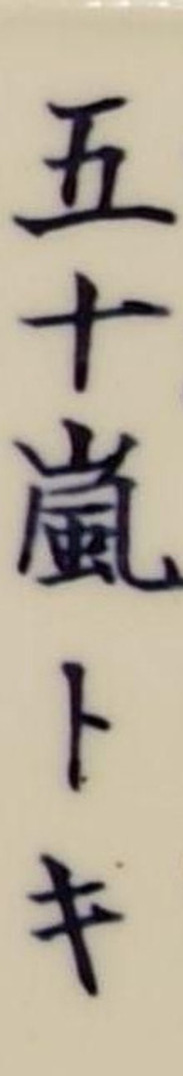五十嵐トキ
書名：A~D
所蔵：koyasan kongobuji
